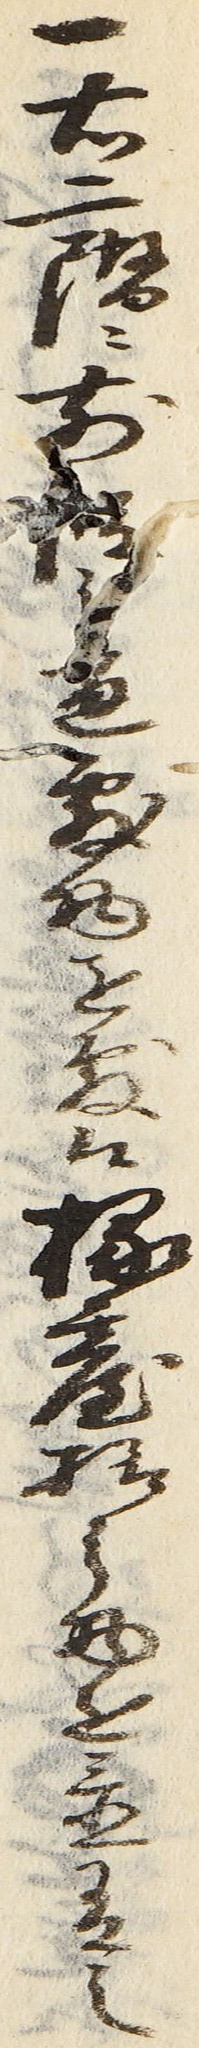一右二階ニ前段之通敷物を敷候椽臺様之物を置有之
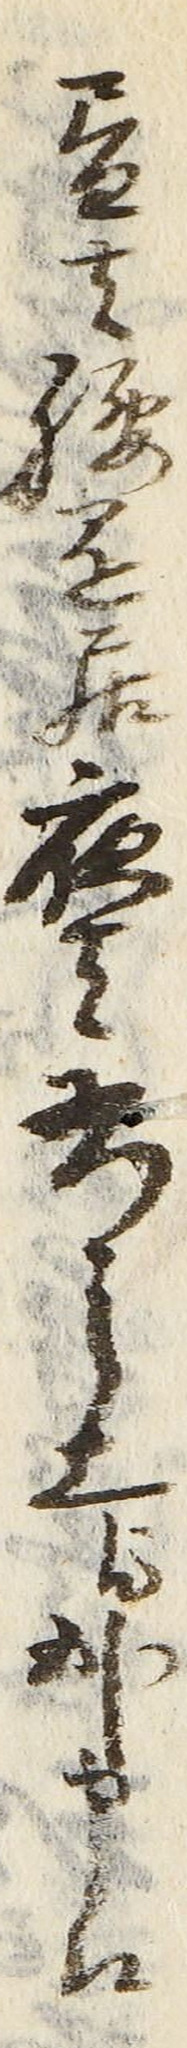晝者腰懸居夜者右之上江臥申候
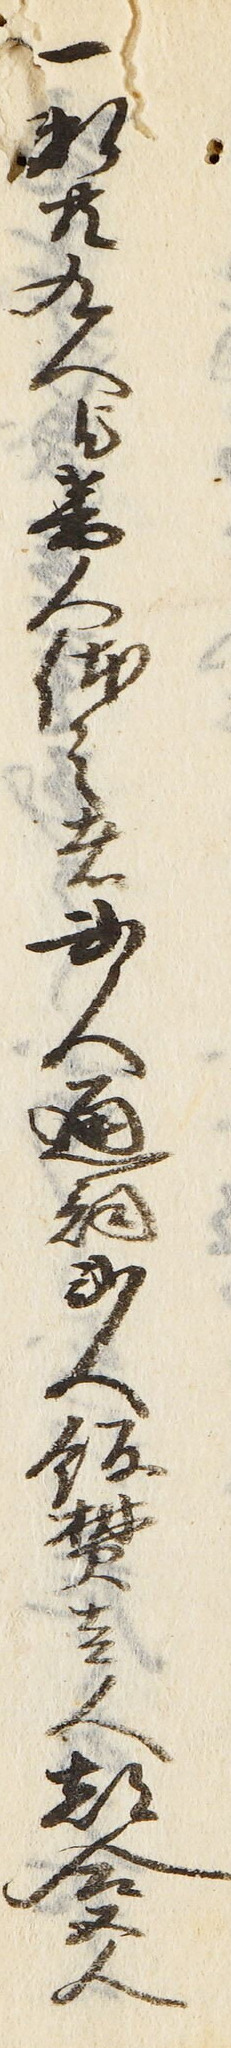一私共九人江番人体之者弐人通詞弐人飯焚壱人都合五人
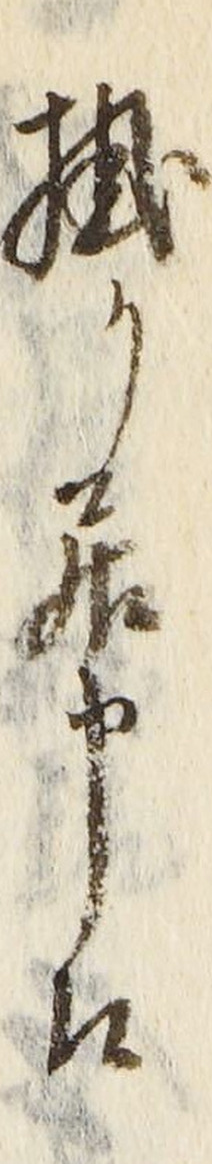掛り居申候
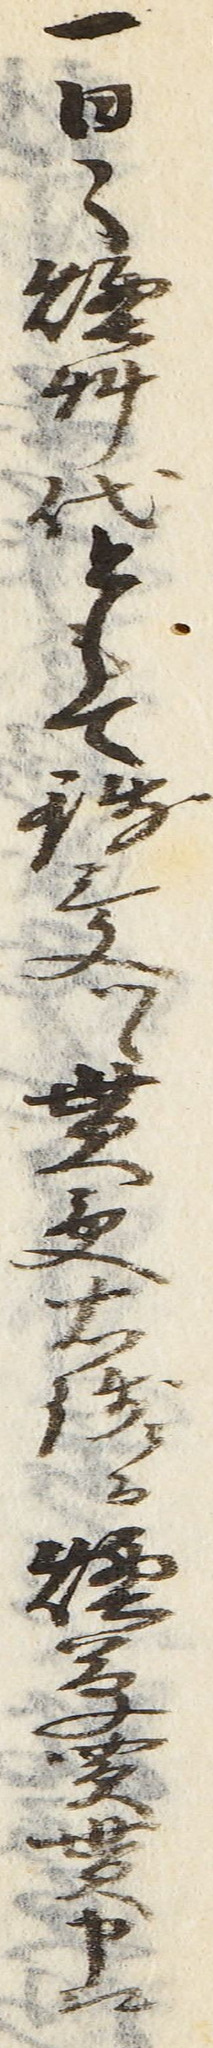一日々煙艸代として銭三文ツヽ貰受右銭ニ而煙草買貰申候
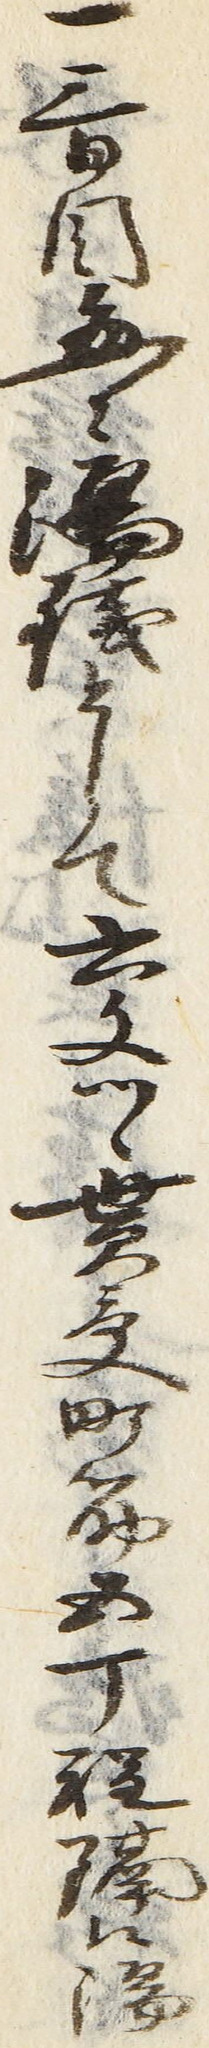一三日目毎々湯銭として六文ツヽ貰受町筋五丁程隔候湯
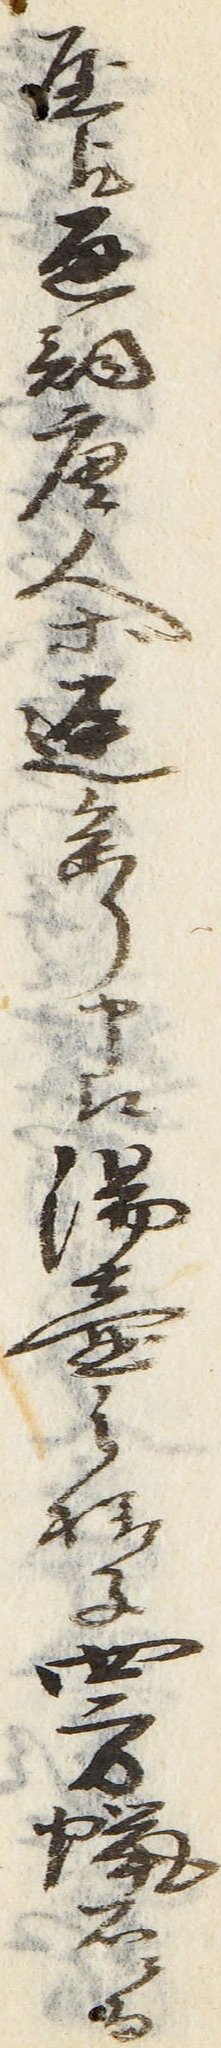屋江通詞唐人等迎参り申候湯壷之様子四方蝋石ニ而
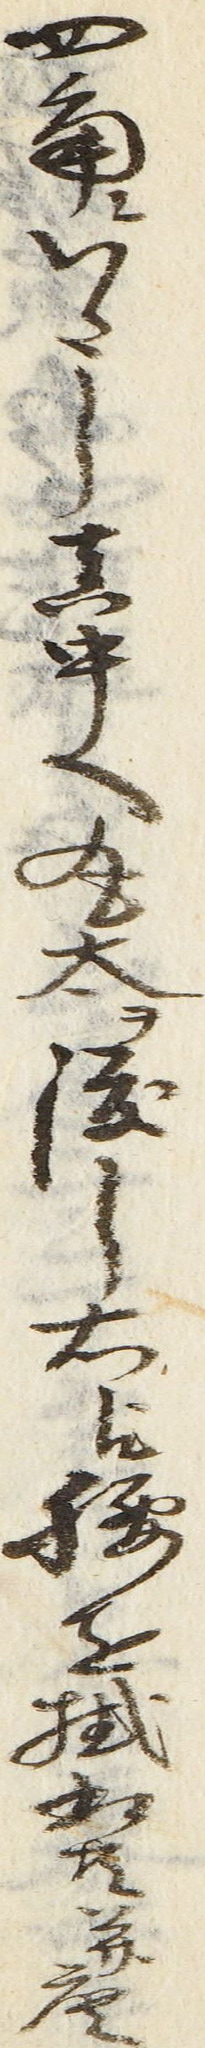四角ニいたし真中へ丸太ヲ渡し右江腰を掛私共幷唐
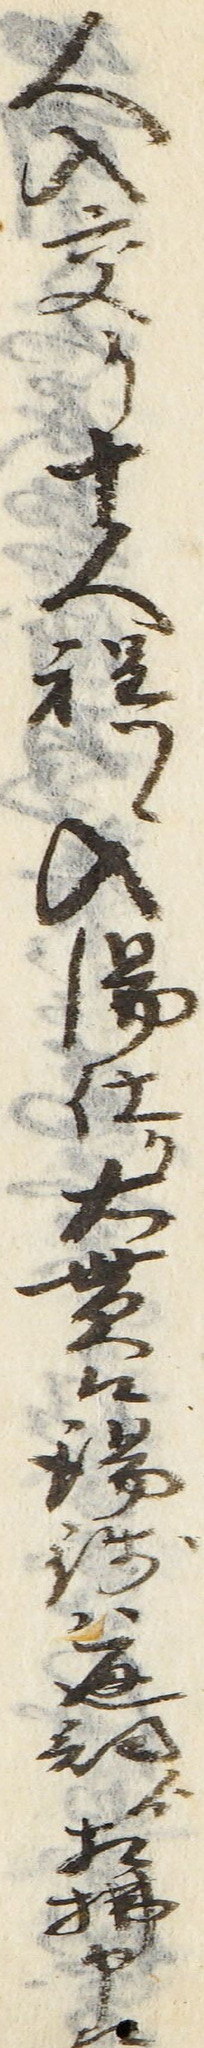人入交り十人程ツヽ入湯仕り右貰候湯銭ハ通詞ゟ相拂申候

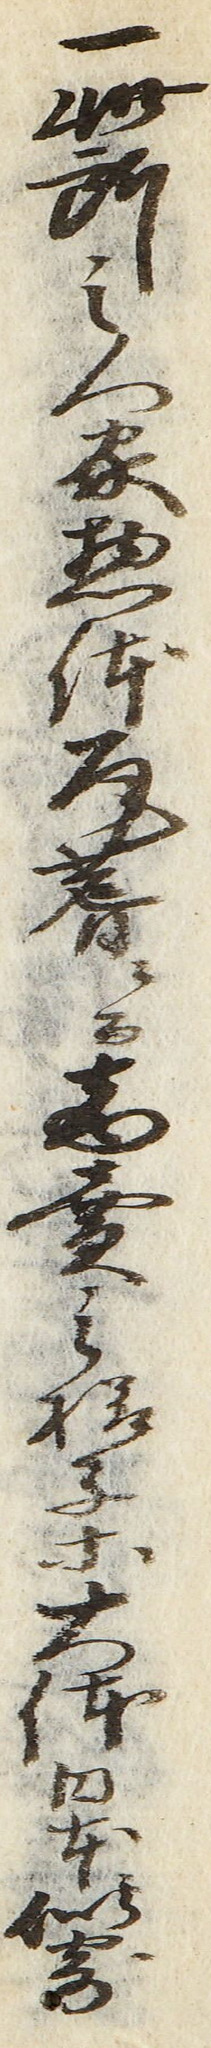一此所之人家惣体瓦葺ニ而商賣之様子等大体日本似寄
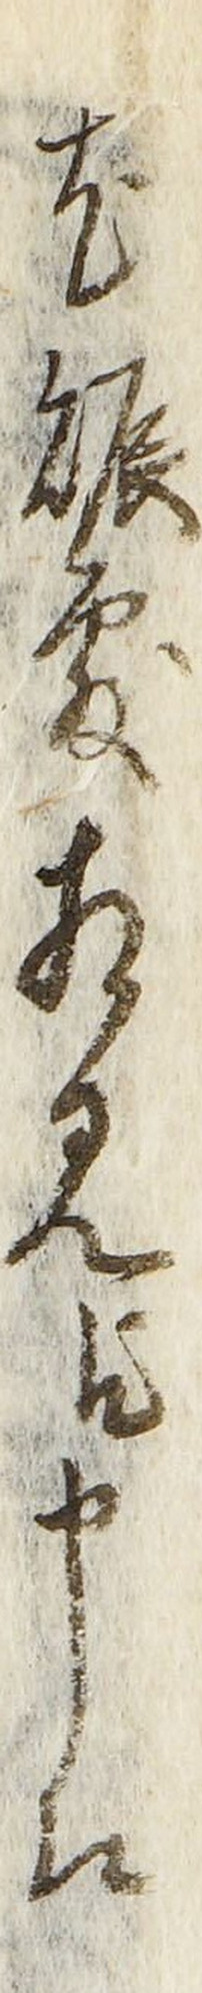尤賑敷相見江申候
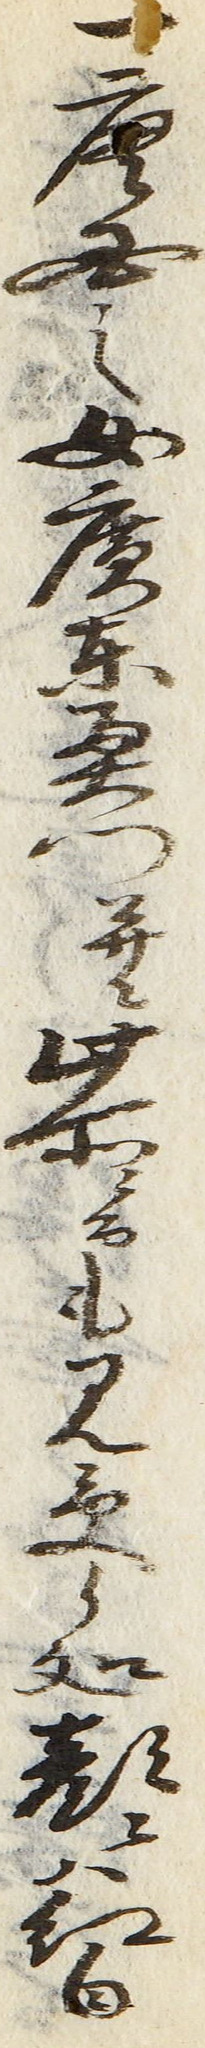一唐国之女廣東奥門幷ニ此所ニ而も見受候処顏ニハ紅白
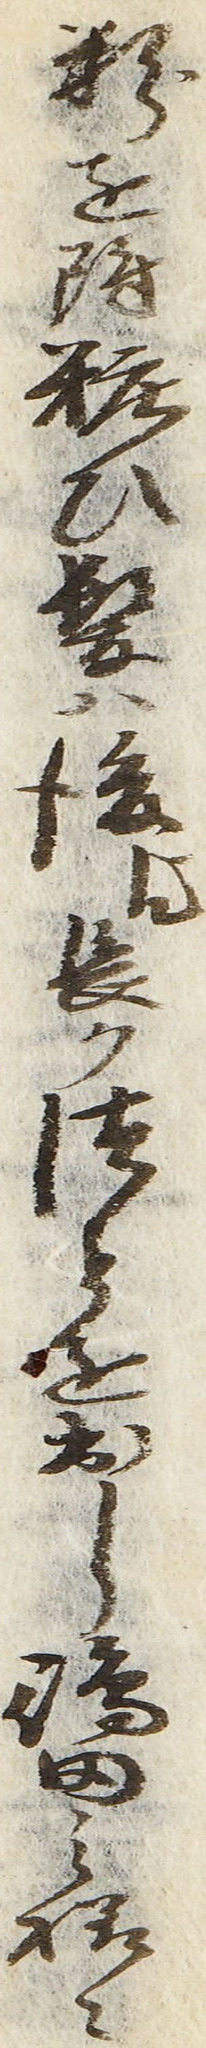粉を附粧ひ髪ハ後江長クつとを出し嶋田之様ニ
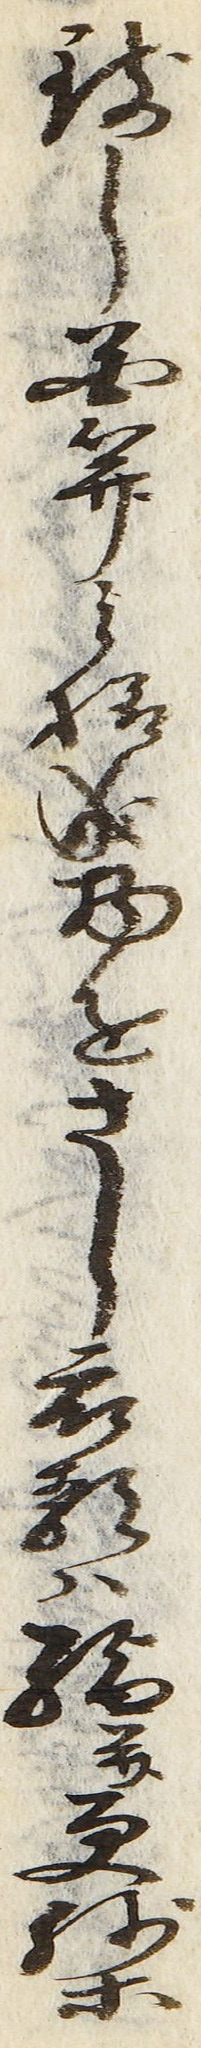致し花笄之様成物をさし衣類ハ絹幷更紗等
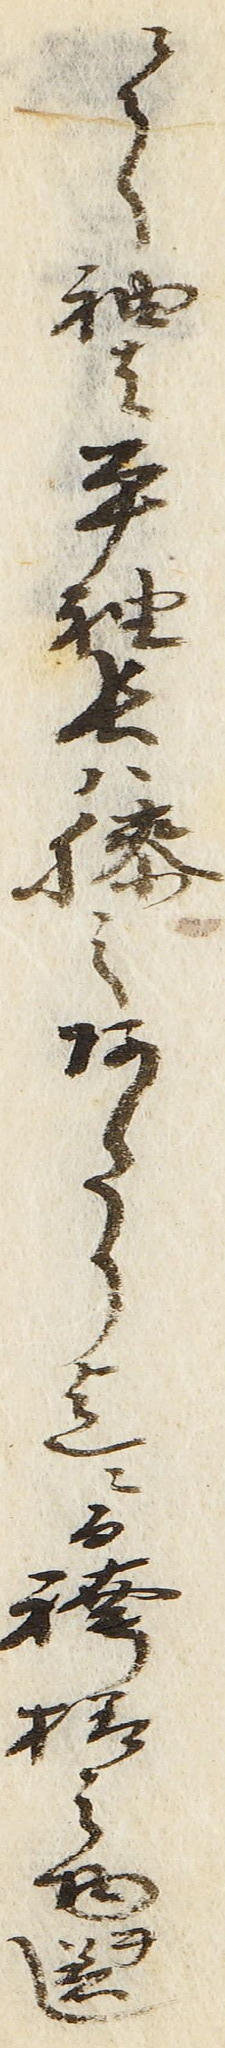ニて袖平袖長ハ膝のあたり迄ニ而袴様之物ヲ着し
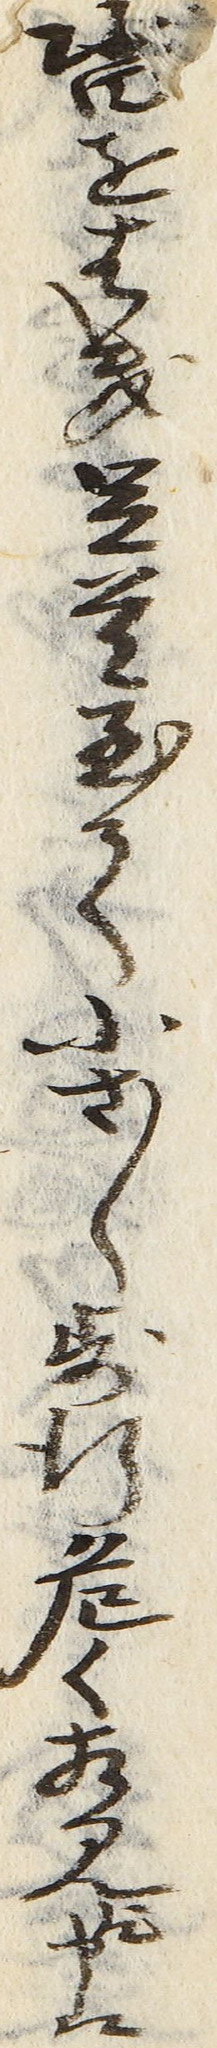沓をはき足首至て小さく歩行危く相見江申候
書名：漂流人善助聞書
